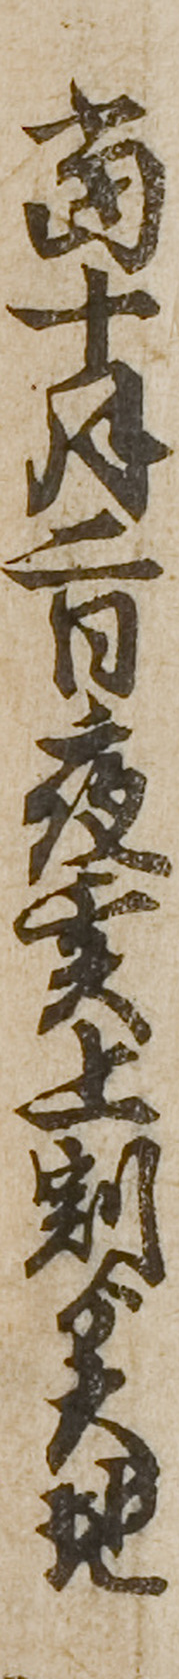当十月二日夜亥上刻ゟ大地
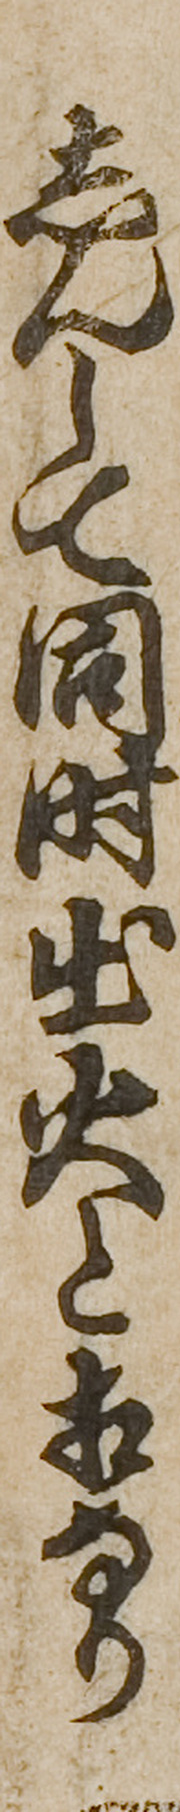しんして同時出火と相なり
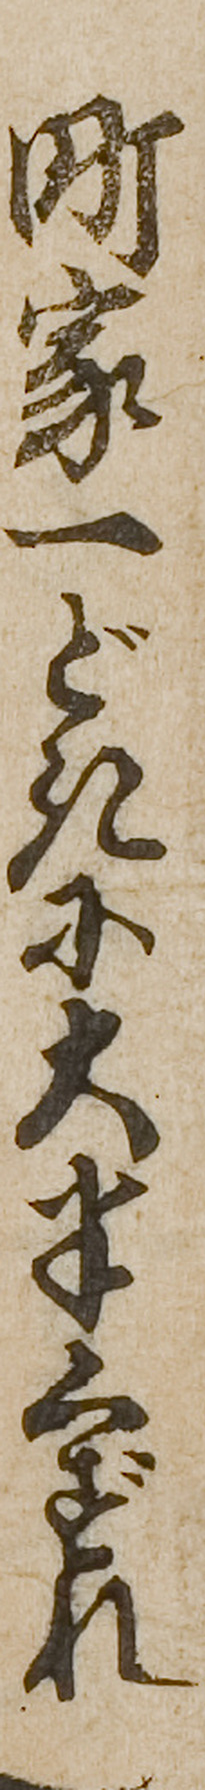町家一どきに大半くずれ
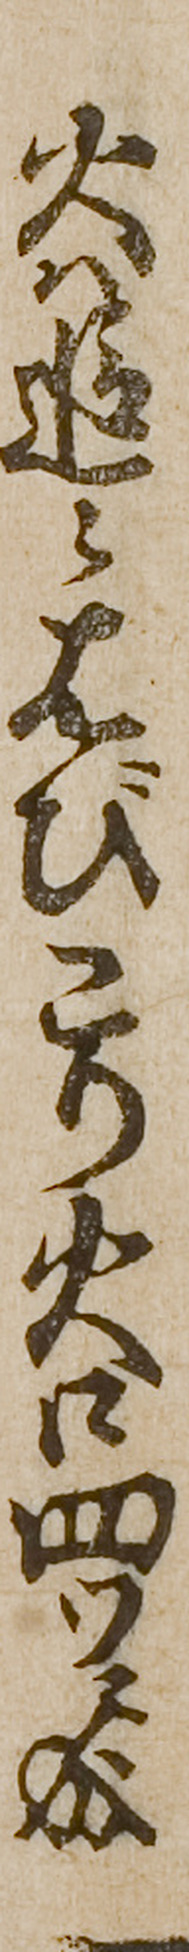火は追々はびこり火口四ツに成
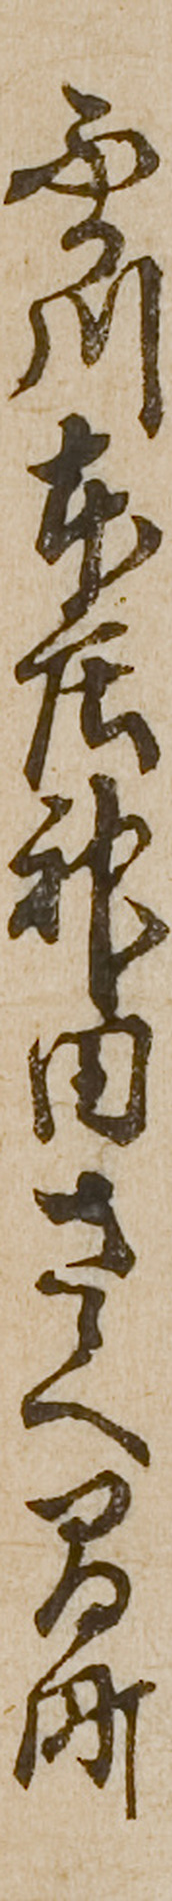ふか川本庄神田さく間町
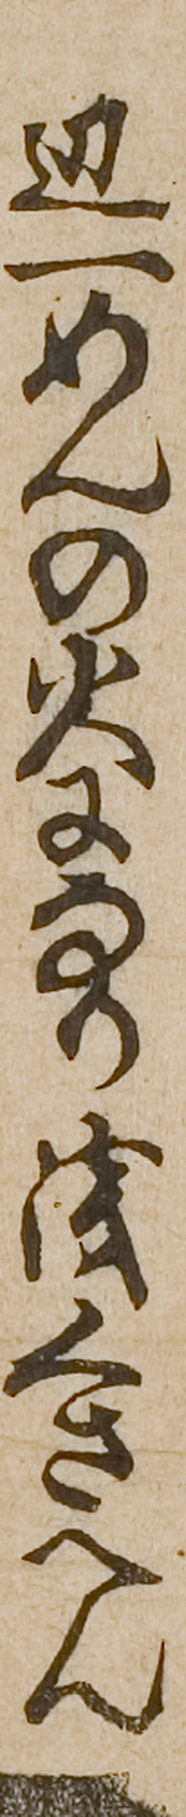辺一めんの火になり浅くさへん
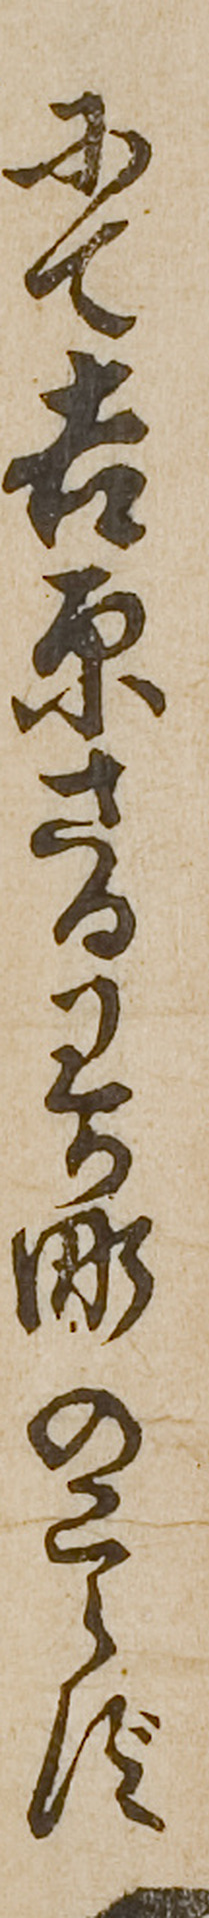にて吉原さるわか町のこらず
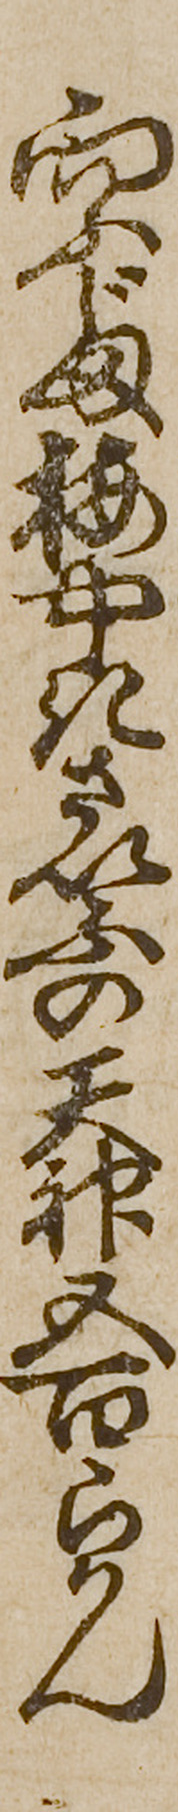向ふじま梅やしきさいふの天神五百らかん
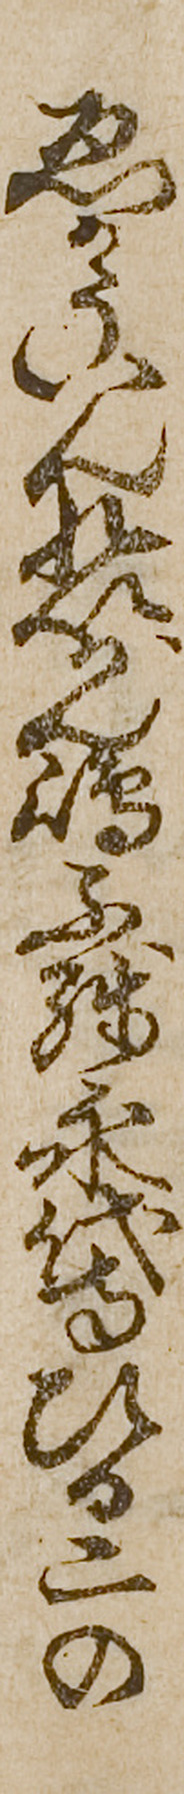ゑかういんれいかん島不残永代寺ひるこの
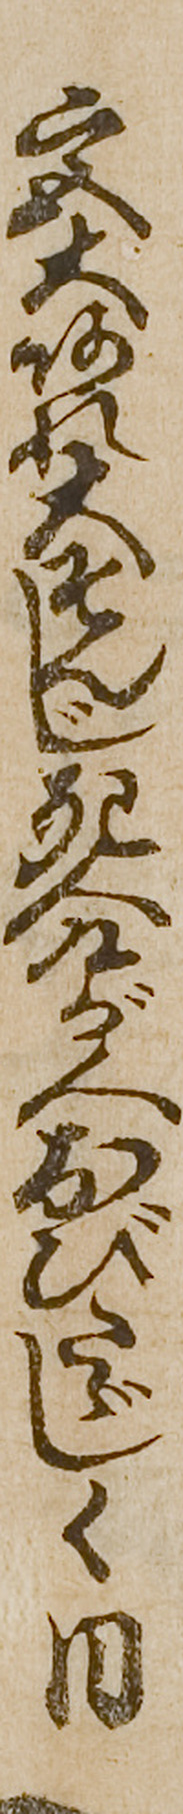宮大あれ大そんじ死人けが人おびただしく日
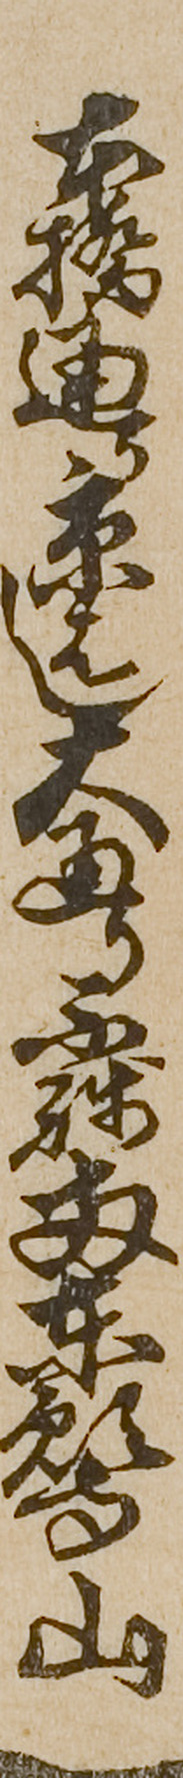本橋通り京はし大通り不残両本願寺山
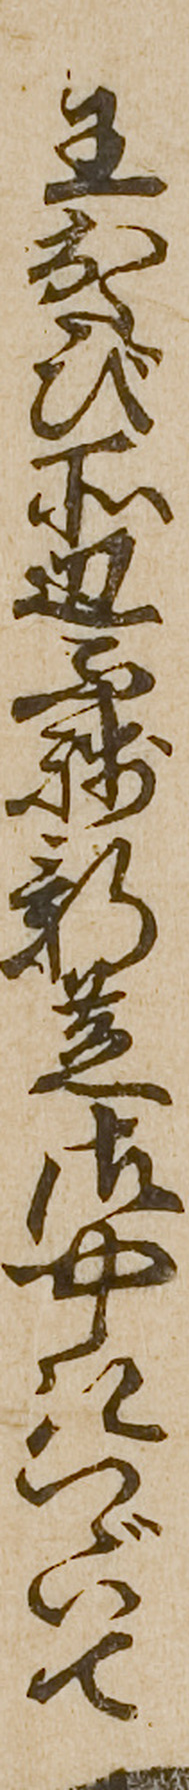王おたび所辺不残新芝御やきつゝいて
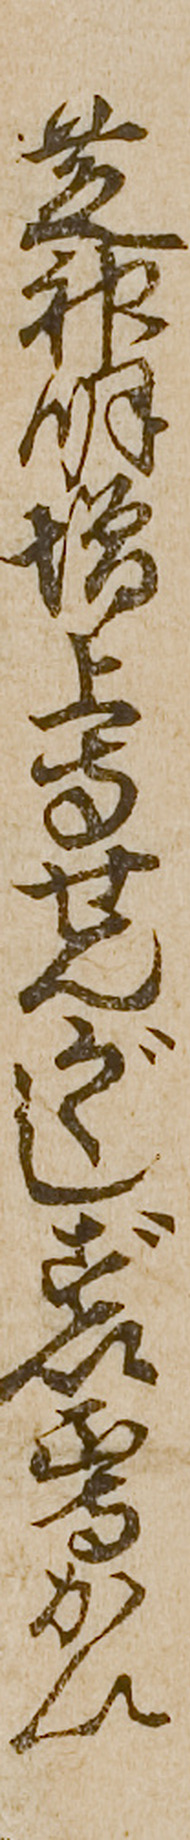芝神明増上寺せんがくしずい正寺かい
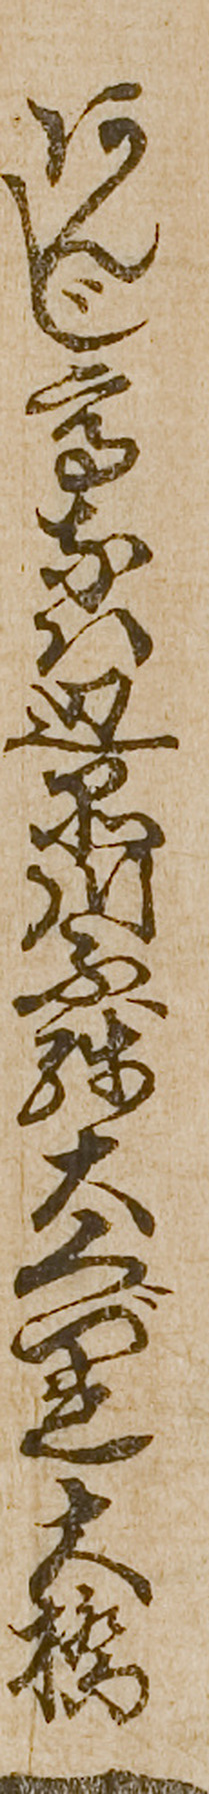あんじ高なは辺品川不残大くづれ大橋
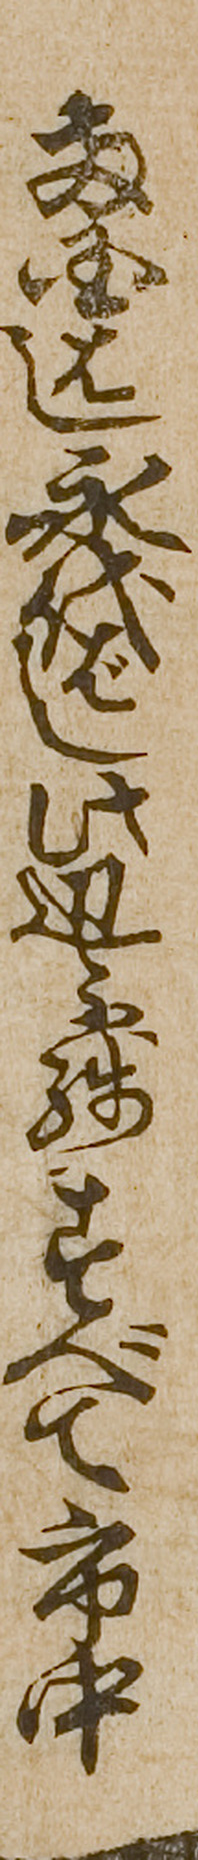両国はし永代ばし此辺不残すべて市中
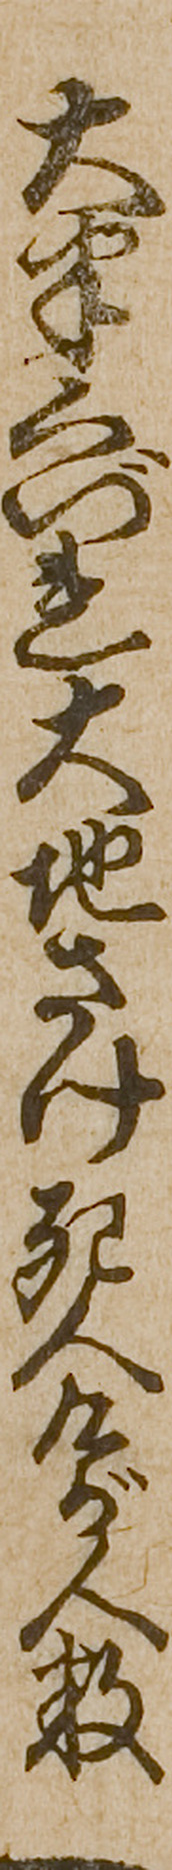大半くづれ大地さけ死人けが人数
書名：[安政地震摺物]
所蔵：東京大学総合図書館 General Library in the University of Tokyo, JAPAN
